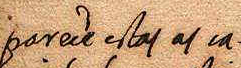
parecē estas as ca
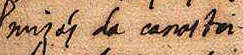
mizas da canastri
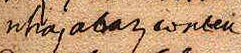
nha atraz conteu
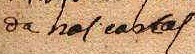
da nas cartas
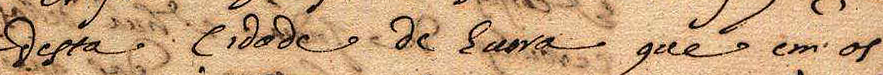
desta Cidade de Euora que em os
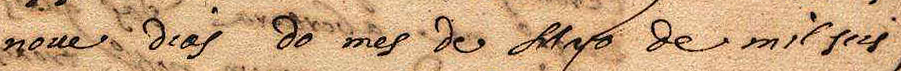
noue dias do mes de Majo de mil seis
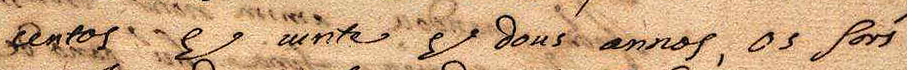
centos E uinte E dous anno, os sors̄
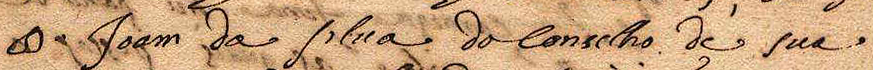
D Joam da silua do conselho de sua
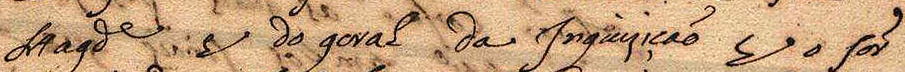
Magde E do geral da Jnquiziçaõ E o sor̄
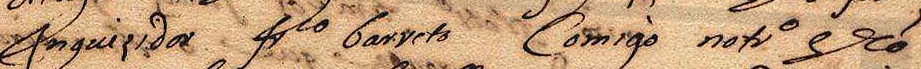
Jnquizidor frco barreto Comigo notro E cō
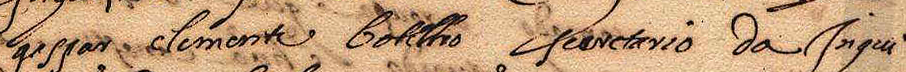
gaspar clemente botelho secretario da Jnqui
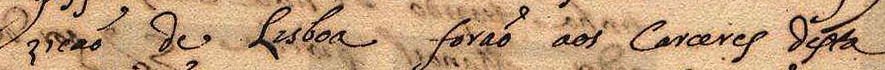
ziçaõ de Lisboa forão aos Carceres desta
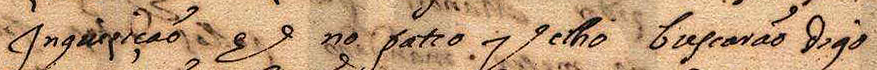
Jnquiziçaõ E no pateo Velho buscarão digo
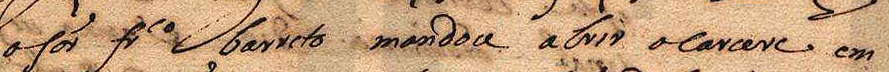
o sōr frco barreto mandou abrir o carcere em
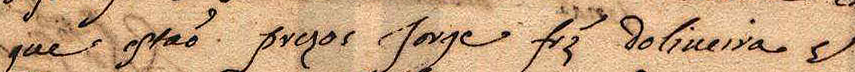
que estaõ prezos Jorge frz̄ doliueira E
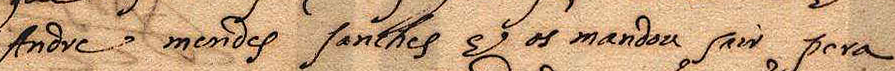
Andre mendes sanches E os mandou sair pera
